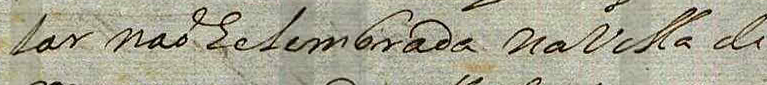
lar naõ he lembrada na villa de
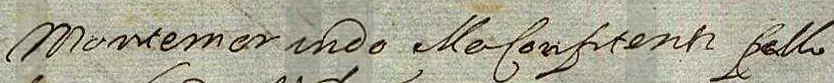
Montemor indo ella Confitente pello
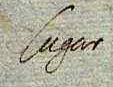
lugar
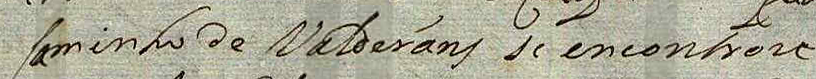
Caminho de Val de rāns se encontrou
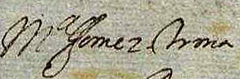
Ma Gomez Irma
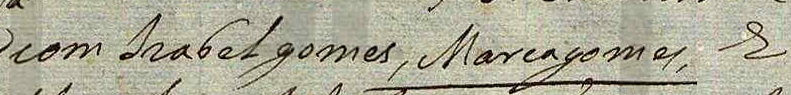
com Izabel gomes, Maria gomes, E
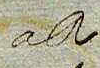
a R
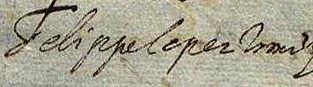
Felippe lopez Irmaõ
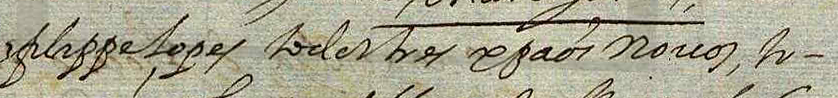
filippe lopes todos tres xpaõs nouos, Ir
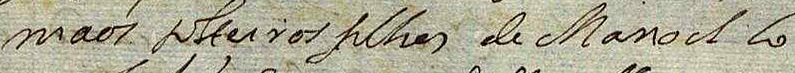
maõs solteiros filhos de Manoel lo
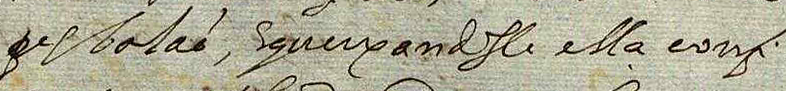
pes balaõ, E queixandosse ella confi
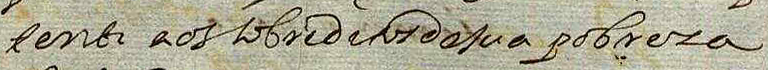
tente aos sobreditos de sua pobreza
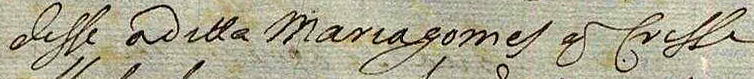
disse a ditta Maria gomes q̄ Cresse
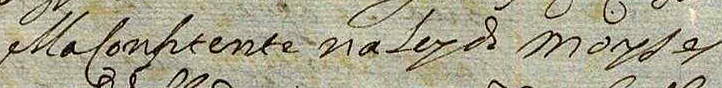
ella Confitente na ley de moyses
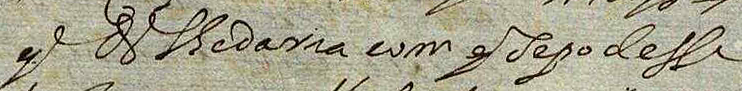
q̄ ds̄ lhe daria com q̄ se podesse
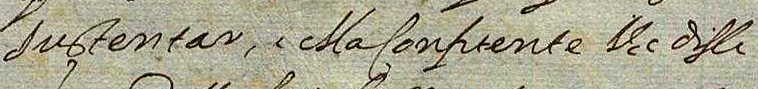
sustentar, e ella Confitente lhe disse
